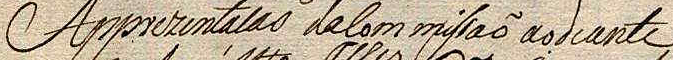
Apprezentaçaõ de Commissaõ aodiante
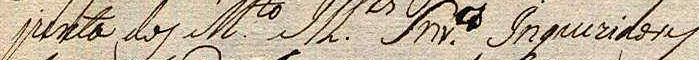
junta dos M.to Ill.es Snr.es Inquizidores
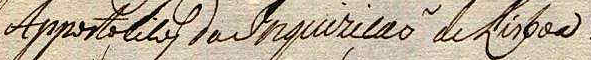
Appostolicos da Inquiziçaõ de Lisboa.
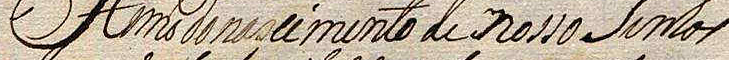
Anno do nascimento de nosso Senhor
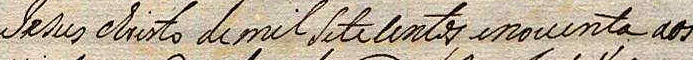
Iesus christo de mil seteCentos, e nouenta, aos
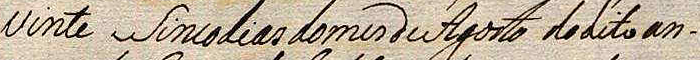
vinte e sinco dias do mes de Agosto do dito an
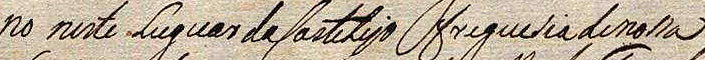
no neste Luguar da Castelejo freguesia de nossa
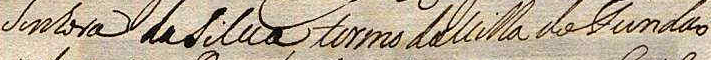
senhora da Silua, termo da Uilla do Fundaõ
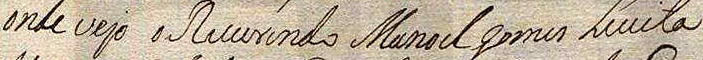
onde vejo o Reuerendo Manoel gomes Leuita
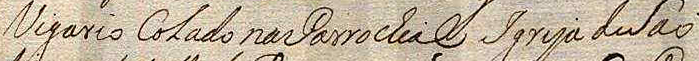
Vigario CoLado na Parrochial Igreja de Saõ
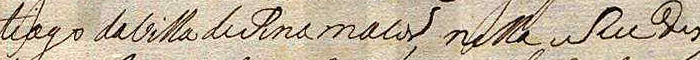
tiago da Villa de Penamacor, nella e seu dis
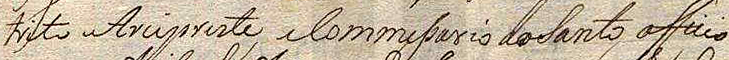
trito Arcipreste, e Commissario do Santo officio
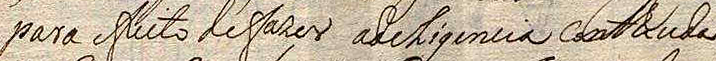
para efeito de fazer a deLigencia contheuda
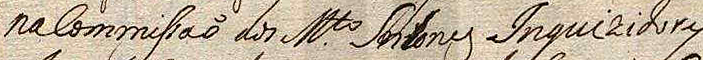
na Commissaõ dos M.to Snhores Inquizidores
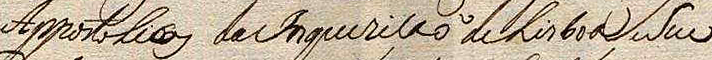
AppostoLicos da Inquiziçaõ de Lisboa, e Seu
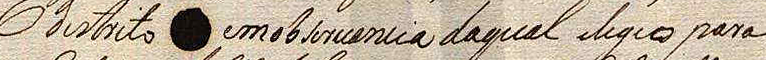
distrito _ em obseruancia da qual elegeo para
